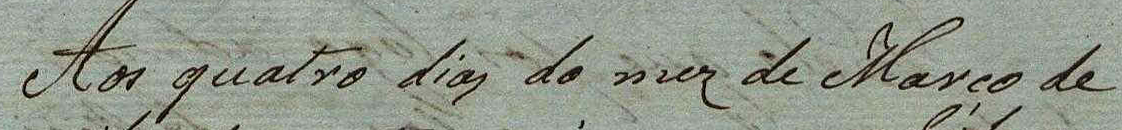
Aos quatro dias do mez de Março de
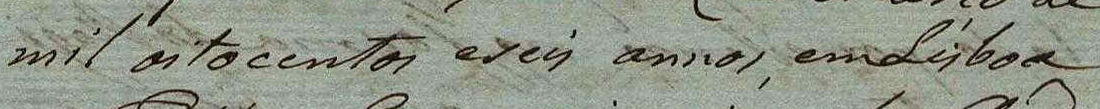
mil oitocentos e seis annos em Lisboa
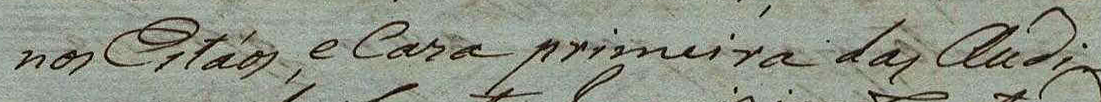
nos Estáos, e Caza primeira das audi
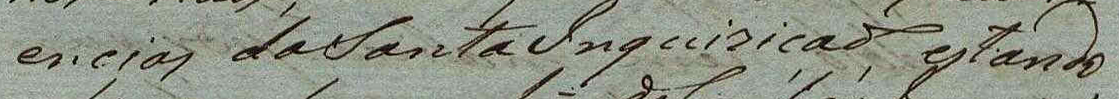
encias da Santa Inquiziçaõ, estando
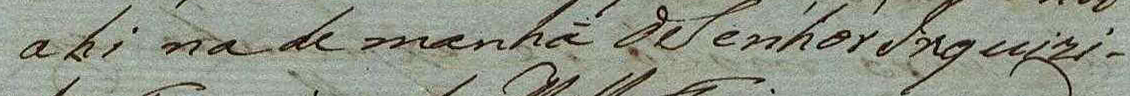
ahi na de manhã o Senhor Inquizi
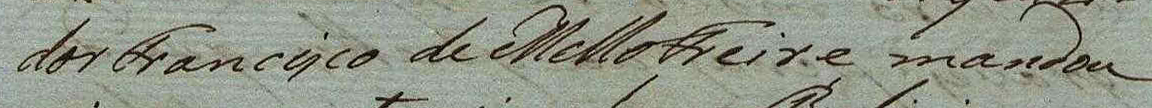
dor Francisco de Mello Freire mandou
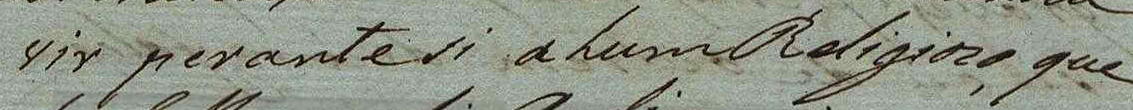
vir perante si a hum Religiozo, que
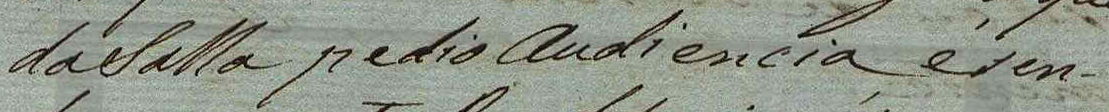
da Salla pedio audiencia e sen
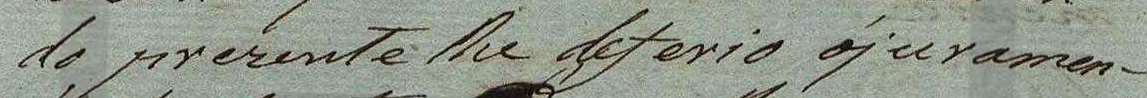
do prezente lhe deferio o juramen
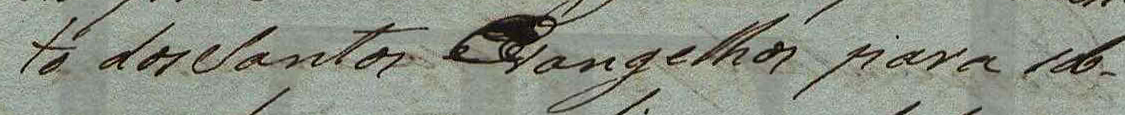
to dos Santos Evangelhos para sob
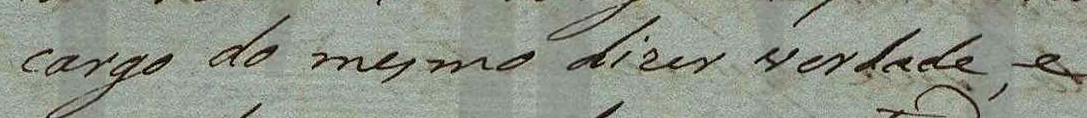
cargo do mesmo dizer verdade e
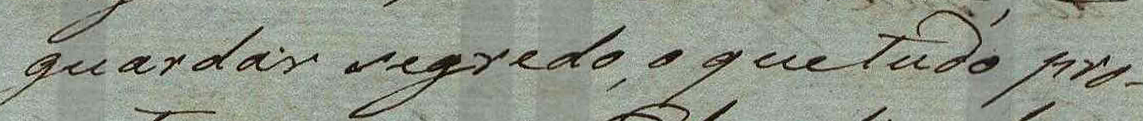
guardar segredo, o que tudo pro
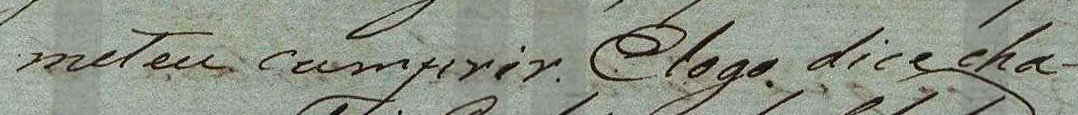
meteu cumprir. E logo dice cha
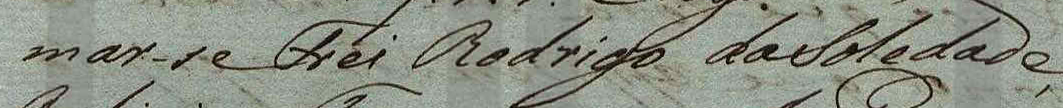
mar-se Frei Rodrigo da Soledade
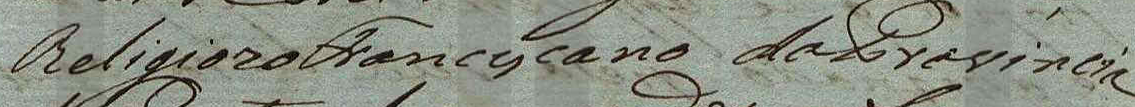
Religiozo Franciscano da Provincia
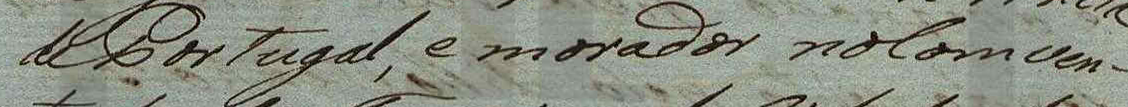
de Portugal, e morador no Conven
